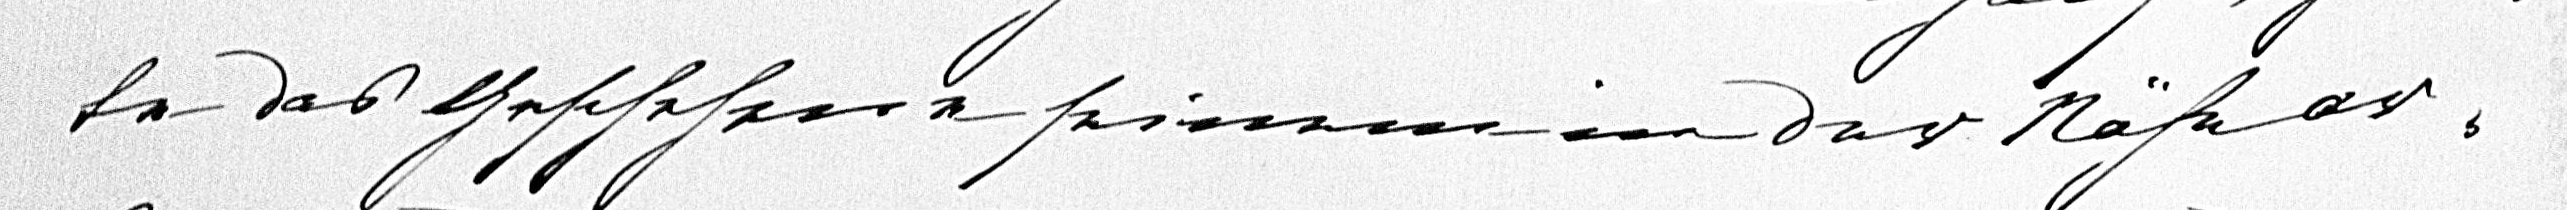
te das Geschehene seinem in der Nähe ar¬
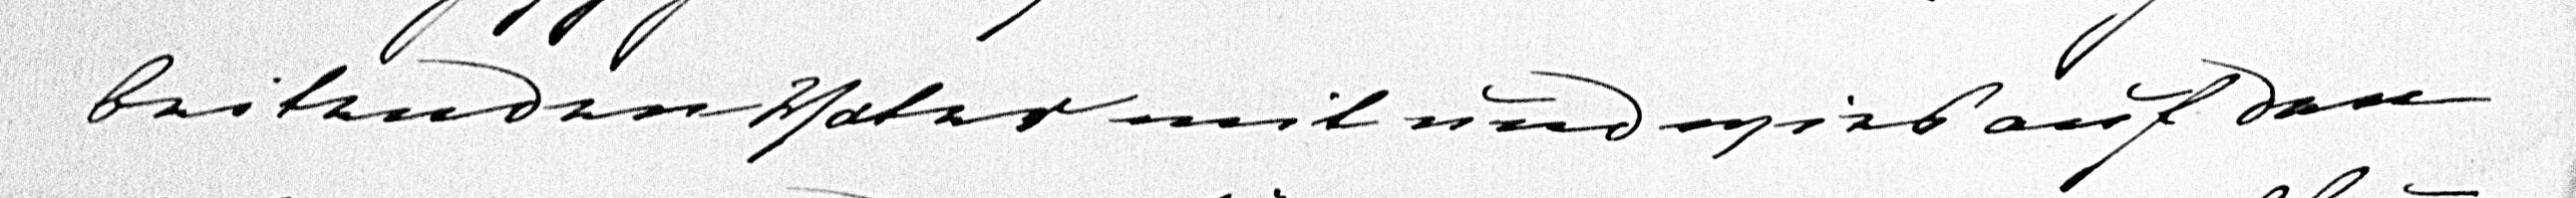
beitenden Vater mit und wies auf den
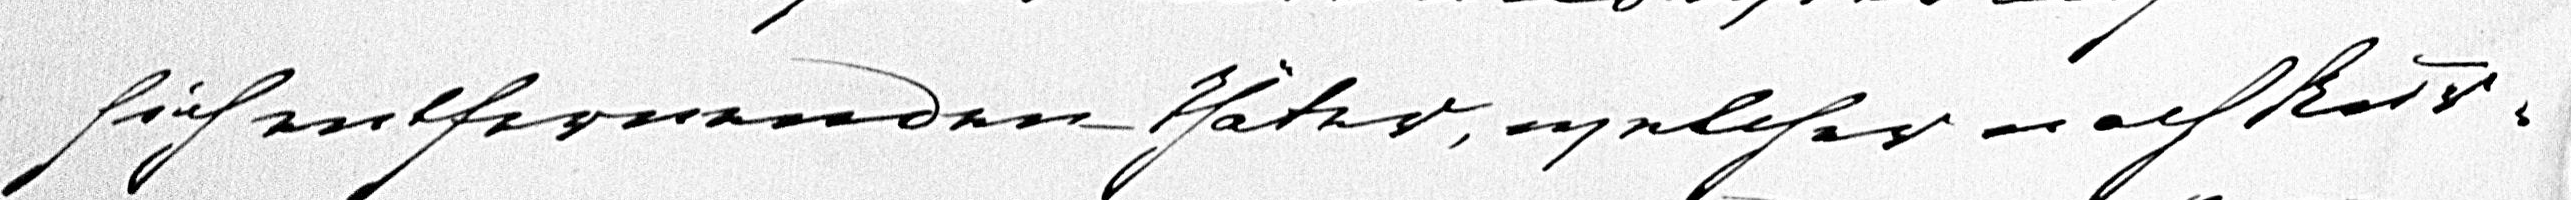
sich entfernenden Thäter, welcher nachkur¬
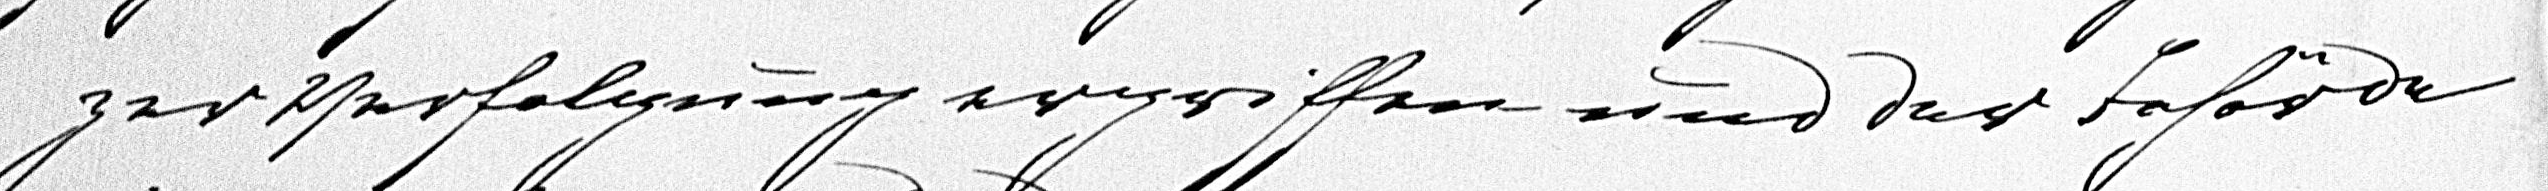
zer Verfolgung ergriffen und der Behörde
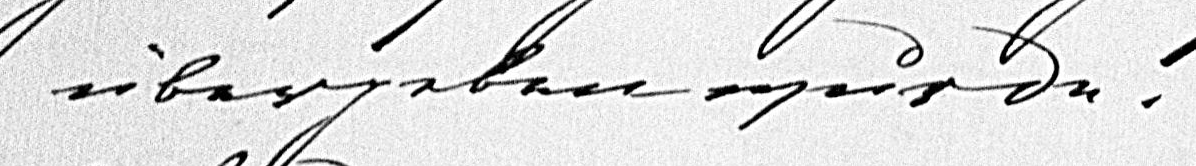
übergeben wurde.
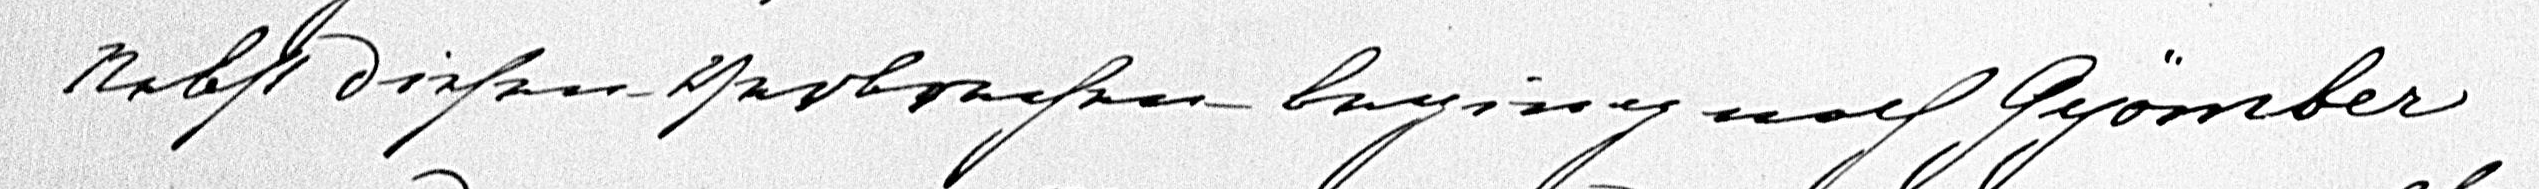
Nebst diesen Verbrechen beging noch Gyömber
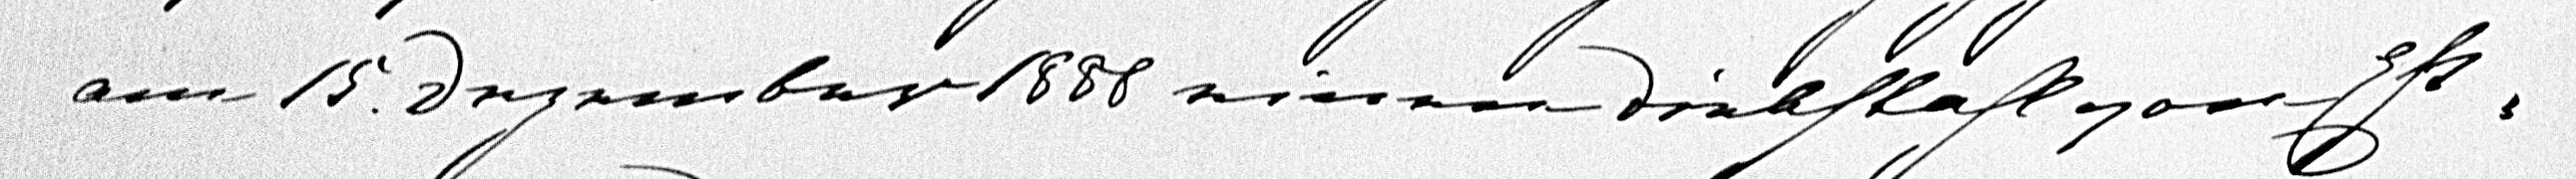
am 15. Dezember 1888 einem diebstahl von Est¬
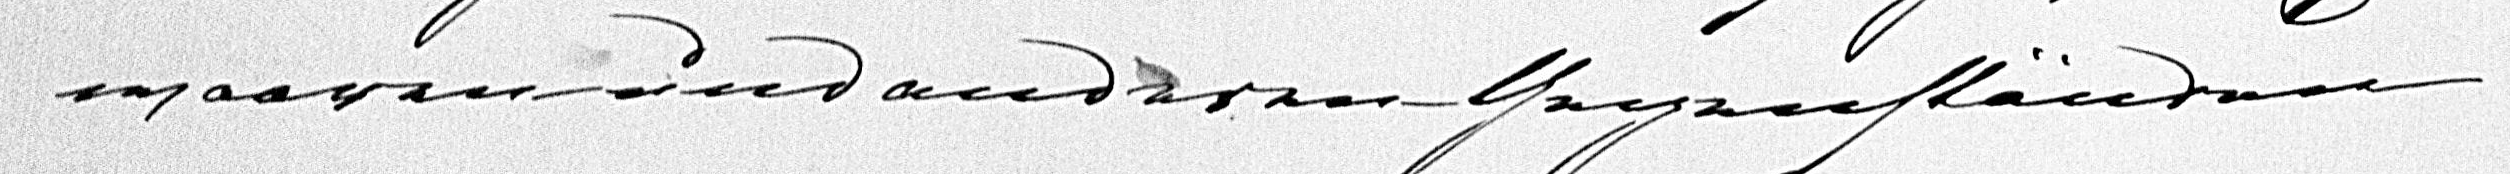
waaren und anderen Gegenständen
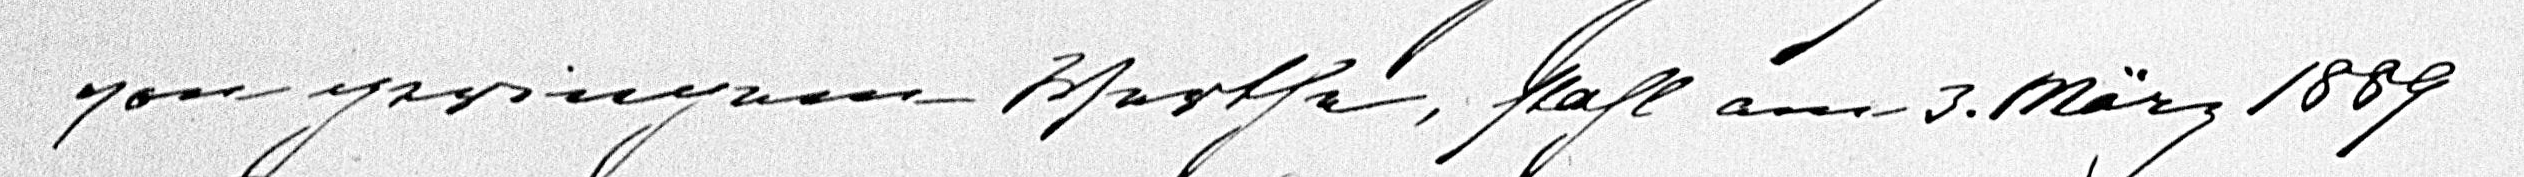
von geringem Werthe, stahl am 3. März 1889
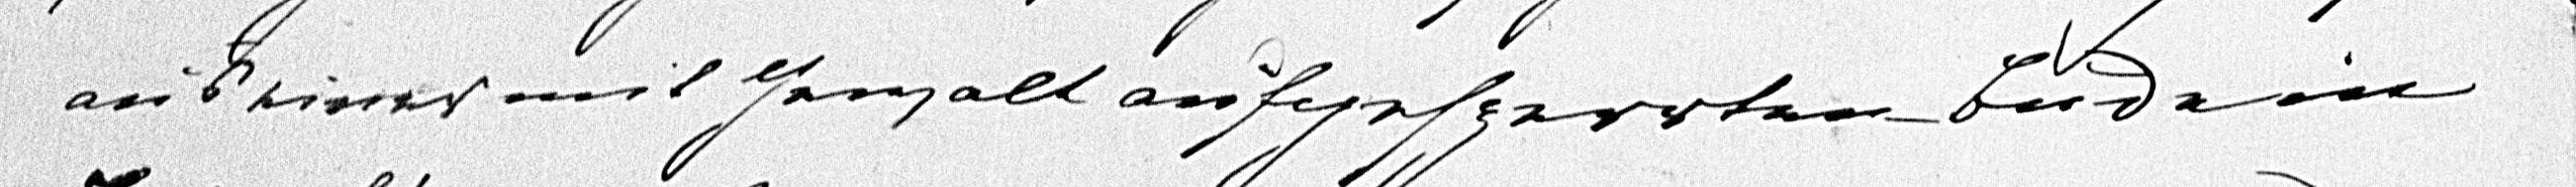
aus eines mit Gewalt aufgesperrten bude in
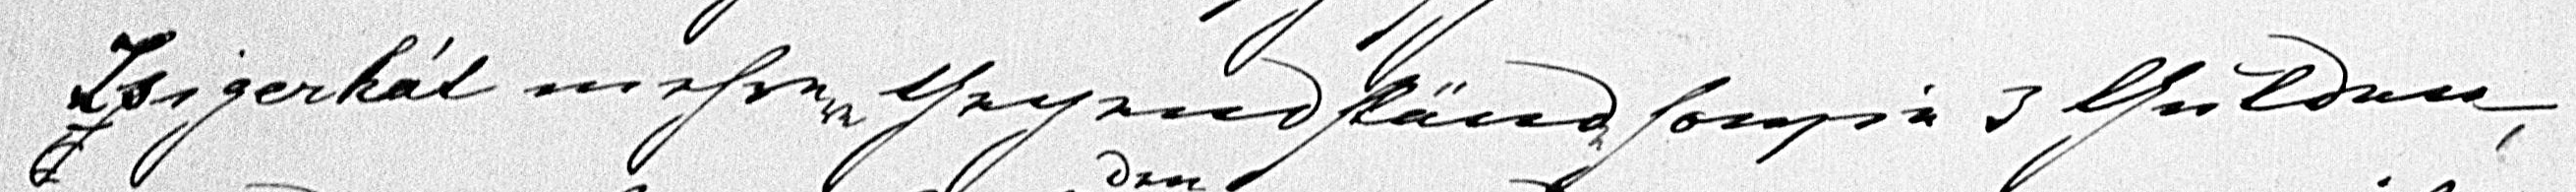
Tsigerkát mehrere Gegend stände sowie 3 Gulden,
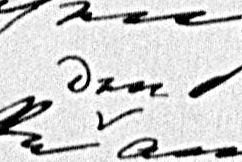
den
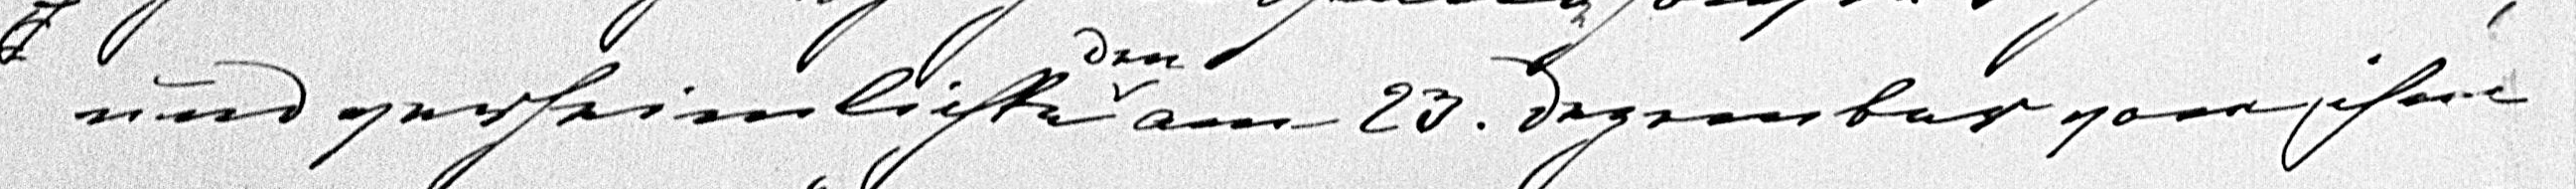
und verheimlichte am 23. Dezember vom ihm
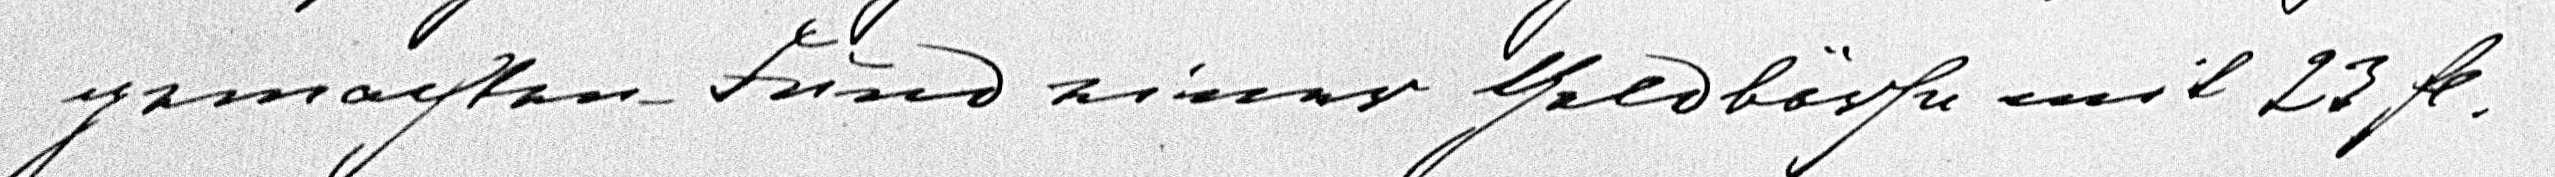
gemachten Fund einer Geldbärhn mit 23 fl.
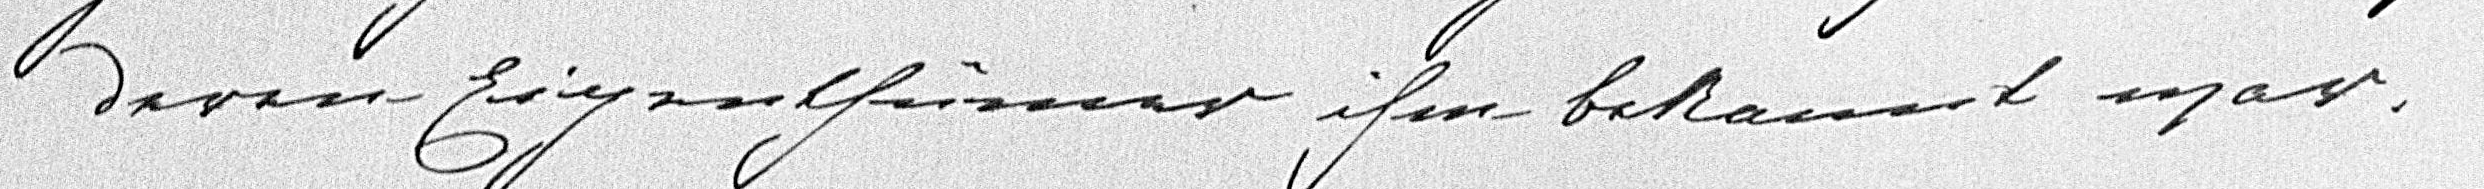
deren Eigenthümer ihm bekannt war.
